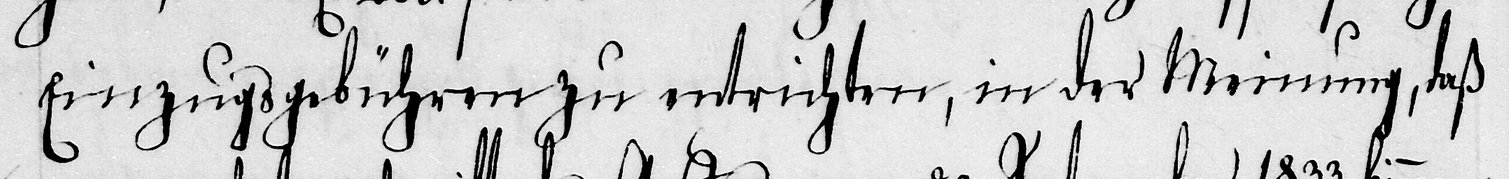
Einzugsgebühren zu entrichten, in der Meinung, daß
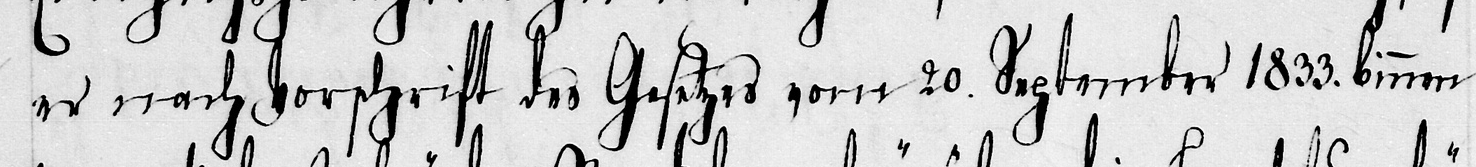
er nach Vorschrift des Gesetzes vom 20. September 1833. binnen
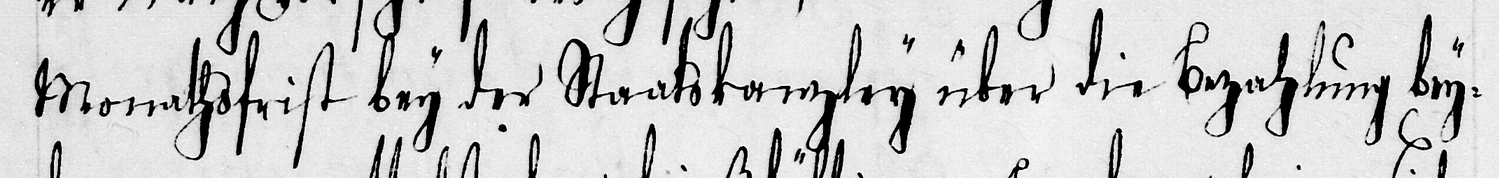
Monathsfrist bey der Staatskanzley über die Bezahlung bey¬
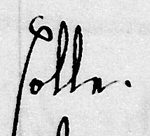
le.
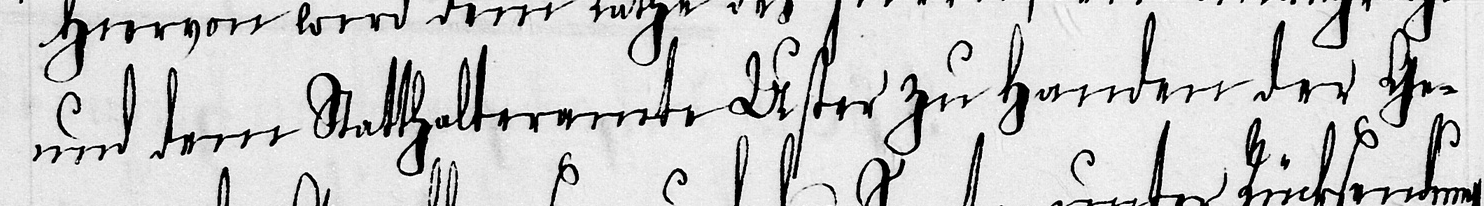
und dem Statthalteramte Uster zu Handen der Ge¬
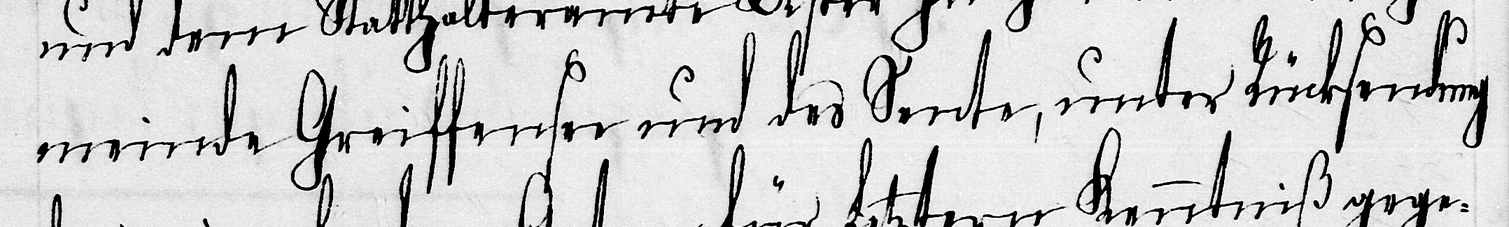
meinde Greiffensee und des Sente, unter Rücksend¬
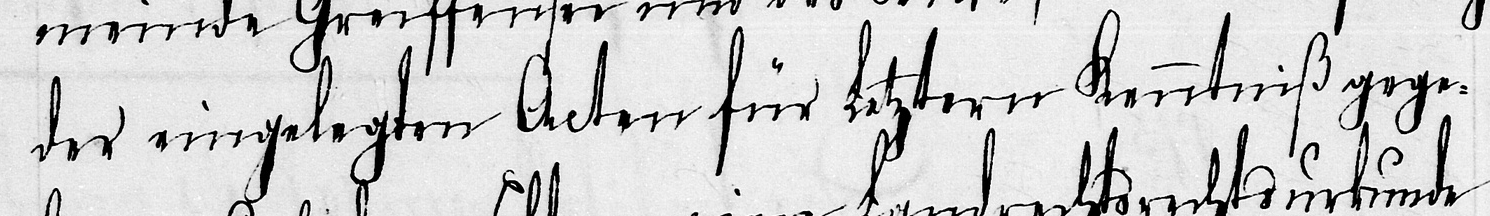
der eingelegten Acten für Letztern Kenntniß gege¬
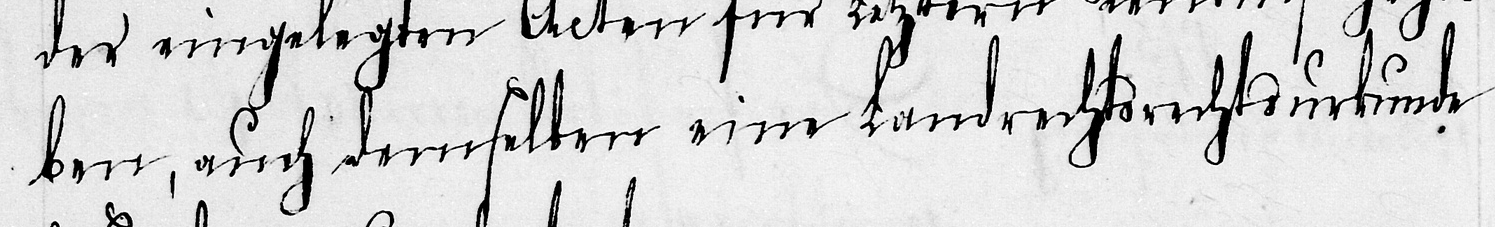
ben, auch demselben eine Landrechtsurkunde
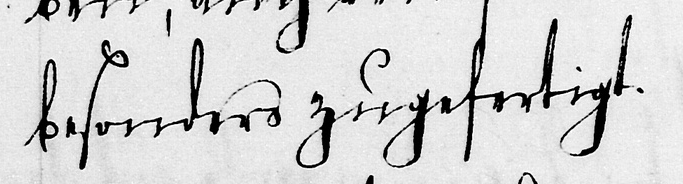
besonders zugefertigt.
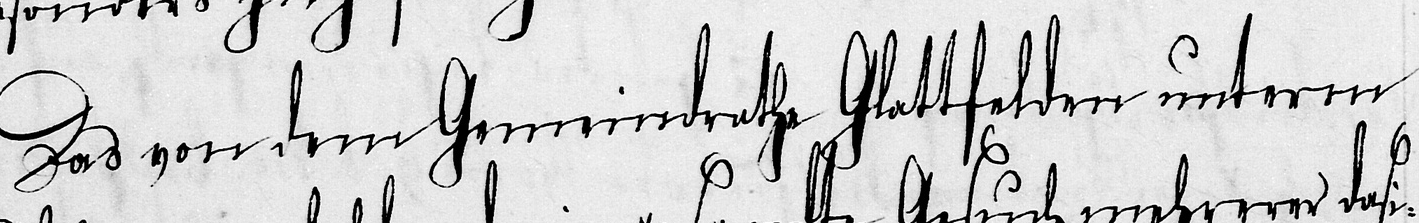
Das von dem Gemeindrathe Glattfelden unterm
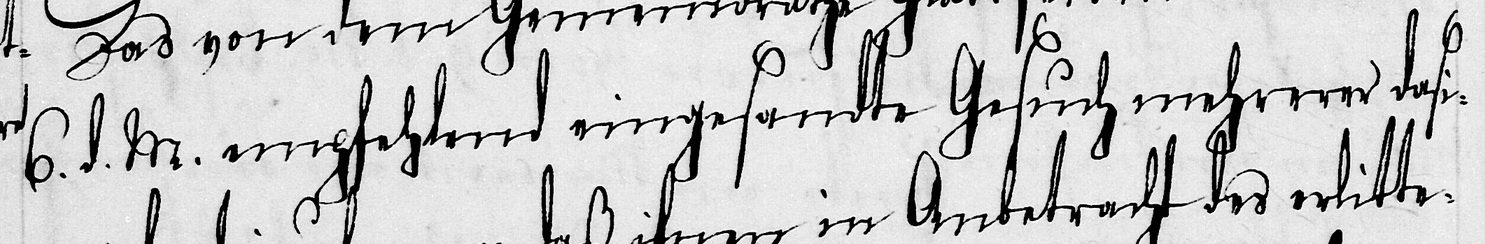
6. d. M. empfehlend eingesandte Gesuch mehrerer das¬
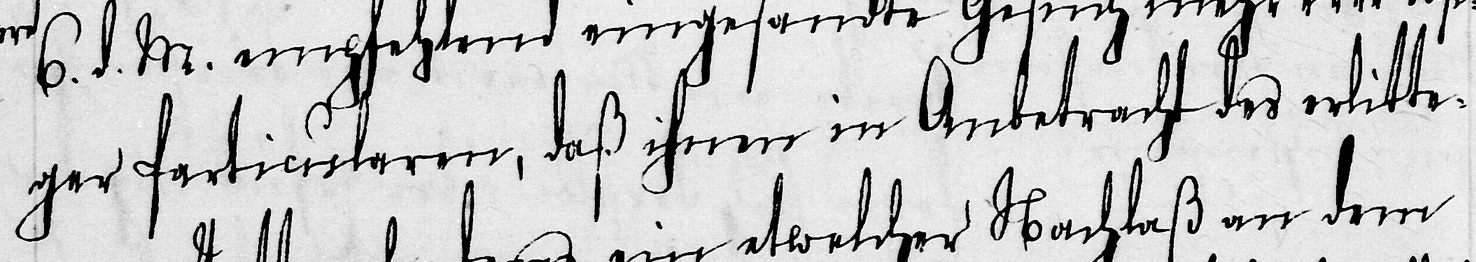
iger Particularen, daß ihnen in Anbetracht des erlitt¬
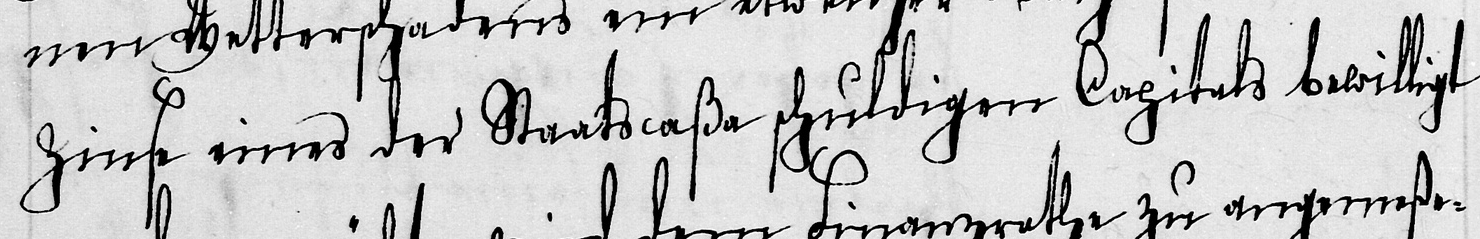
Zinse eines der Staatcaßa schuldigen Capitals bewilligt
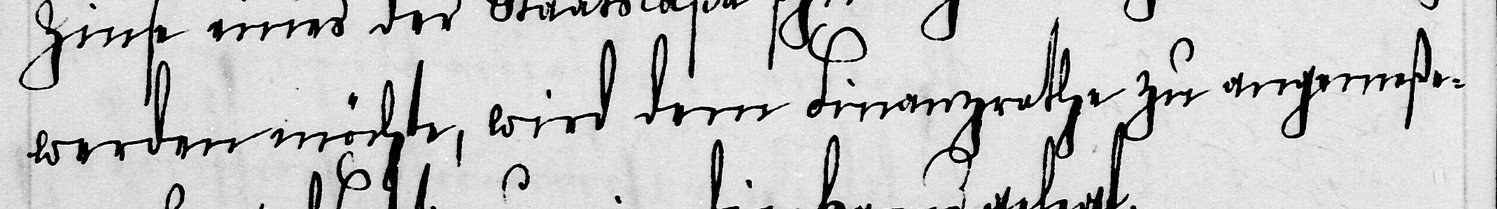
werden möchte, wird dem Finanzrathe zu angemeße¬
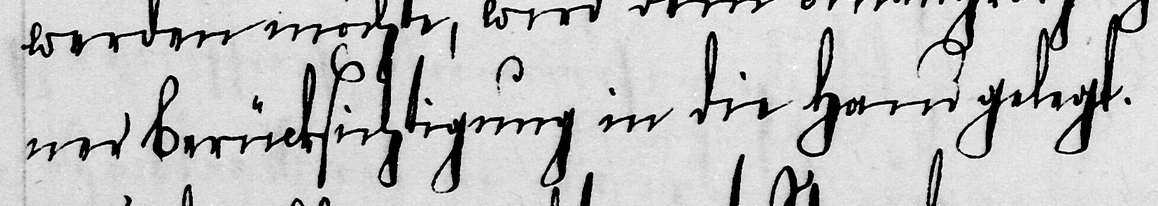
ner Berücksichtigung in die Hand gelegt.
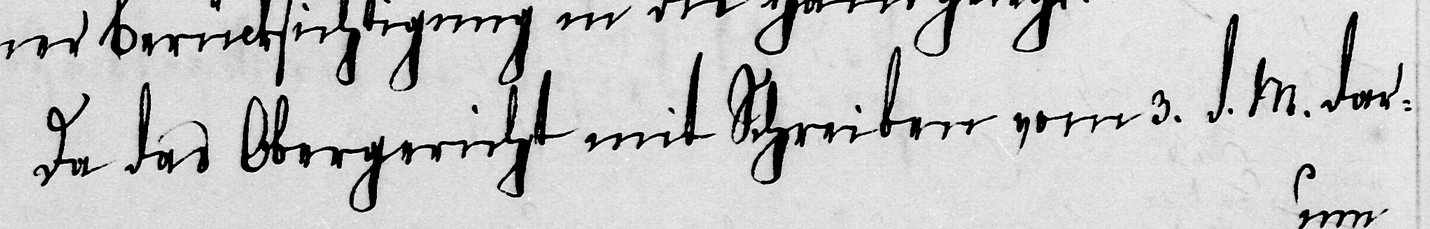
Da das Obergericht mit Schreiben vom 3. d. M. dar-
